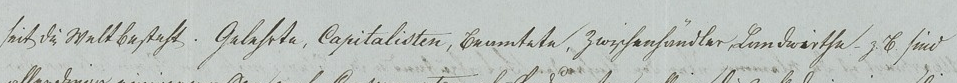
seit die Welt besteht. Gelehrte, Capitalisten, Beamtete, Zwischenhändler, Landwirthe – z. B. sind
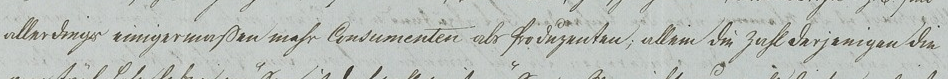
allerdings einigermaßen mehr Consumenten als Produzenten; allein die Zahl derjenigen die
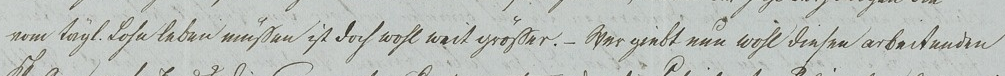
vom tägl. Lohn leben müssen ist doch wohl weit größer. – Wer giebt nun wohl diesen arbeitenden
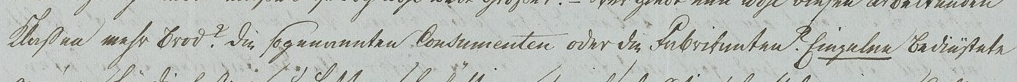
Klassen mehr Brod? Die sogenannten Consumenten oder die Fabrikanten? Einzelne Bedienstete
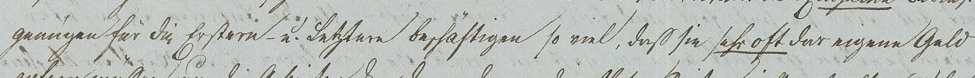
genügen für die Erstern – u. Letztere beschäftigen so viel, daß sie sehr oft das eigene Geld
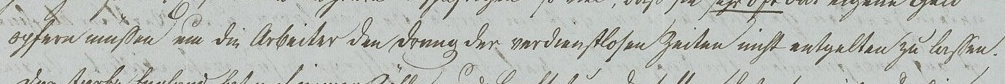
opfern müssen um die Arbeiter den Drang der verdienstlosen Zeiten nicht entgelten zu lassen.
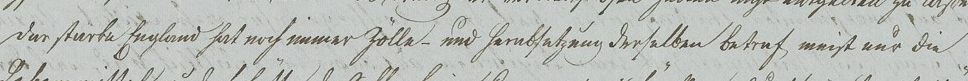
Das starke England hat noch immer Zölle – und Herabsetzung derselben betraf meist nur die
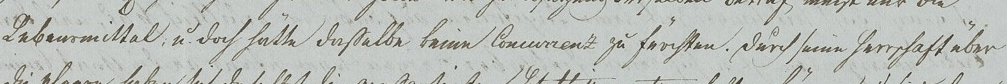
Lebensmittel; u. doch hätte dasselbe keine Concurrenz zu fürchten. Durch seine Herrschaft über
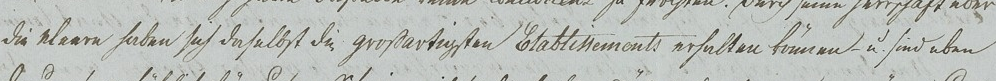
die Meere haben sich daselbst die großartigsten Etablissements erhalten können – u. sind eben
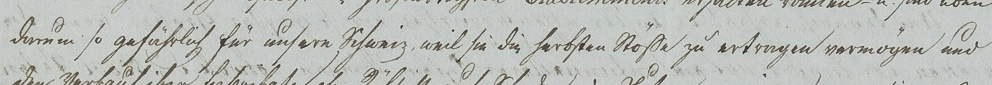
darum so gefährlich für unsere Schweiz, weil sie die herbsten Stöße zu ertragen vermögen und
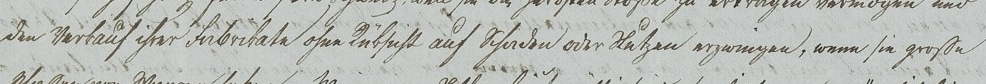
den Verkauf ihrer Fabrikate ohne Rüksicht auf Schaden oder Nutzen erzwingen, wenn sie große
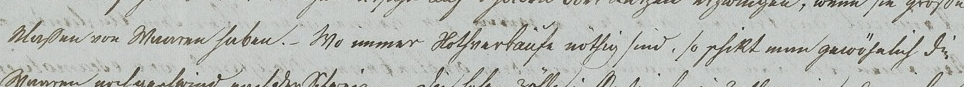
Massen von Waaren haben. – Wo immer Nothverkäufe nöthig sind, so schikt man gewöhnlich die
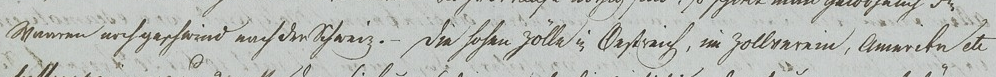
Waaren noch geschwind nach der Schweiz. – Die hohen Zölle in Oestreich, im Zollverein, Amerika etc
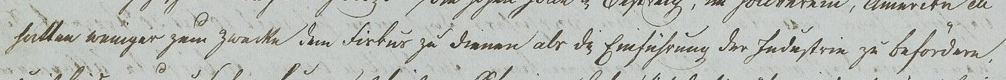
hatten weniger zum Zwecke dem Fiskus zu dienen als die Einführung der Industrie zu befördern,
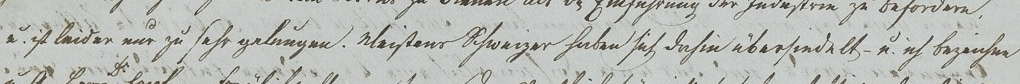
u. ist leider nur zu sehr gelungen. Meistens Schweizer haben sich dahin übersiedelt – u. ich bezeichne
